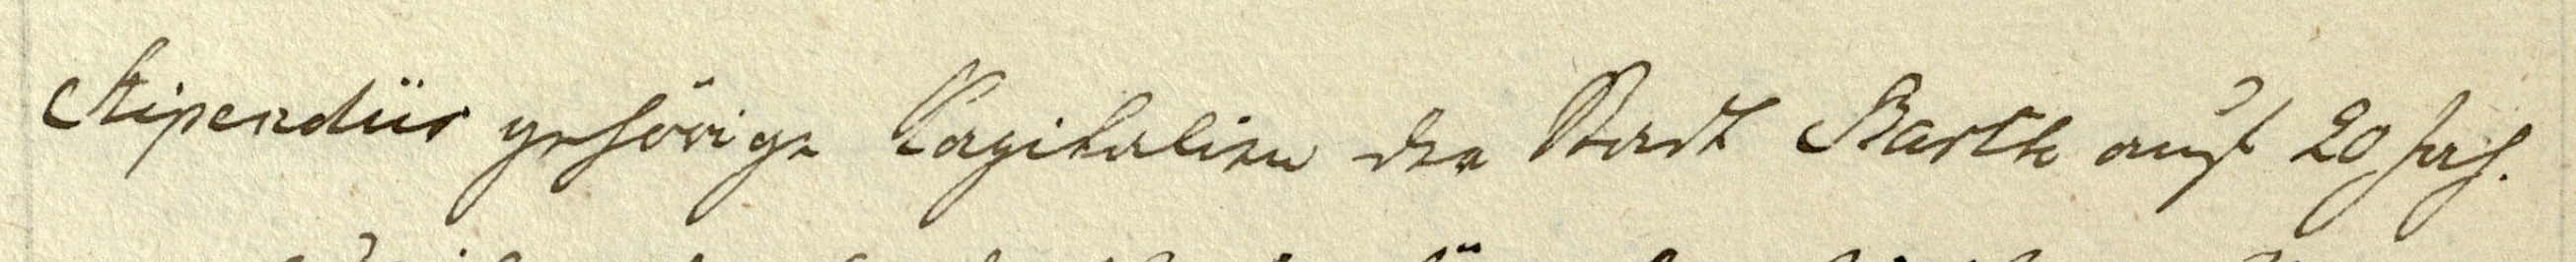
Stipendiis gehörige Capitalien der Stadt Barth auf 20 Jah¬
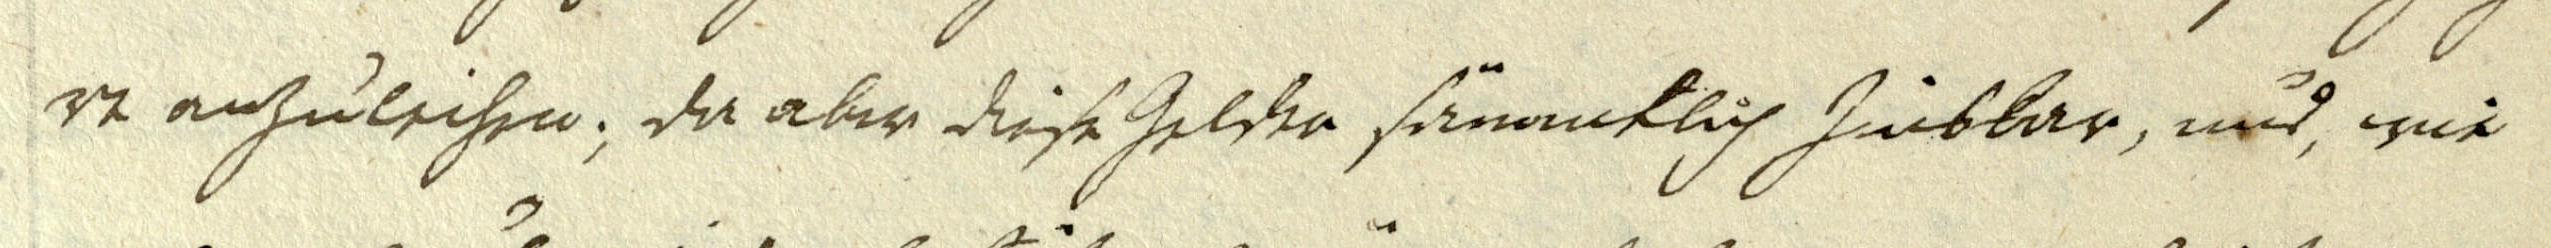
re anzuleihen; da aber diese Gelder sämmtlich zinsbar, und, wie
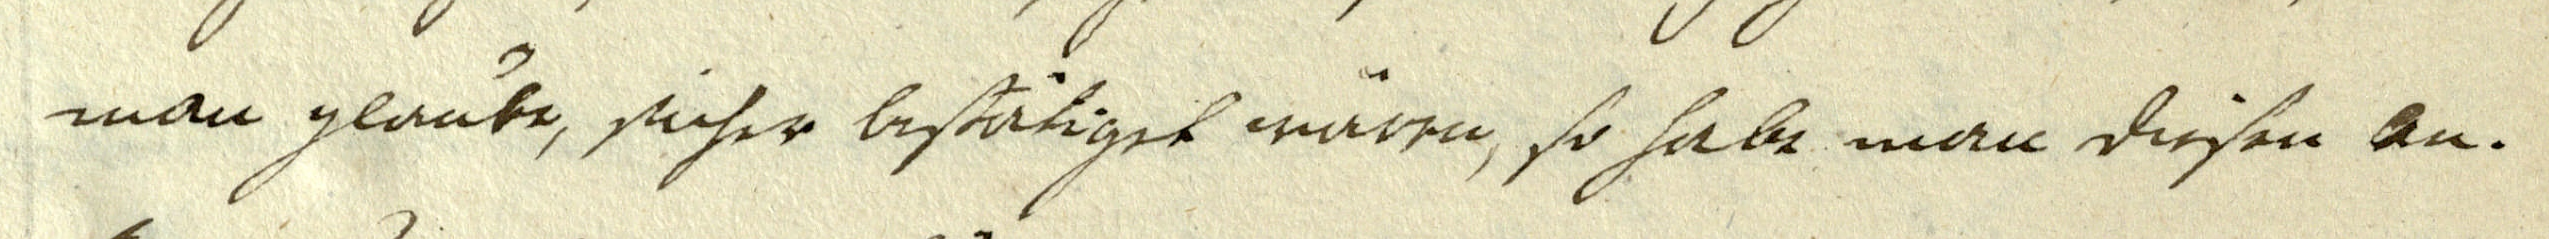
man glaube, sicher bestätiget wären, so habe man diesen An¬
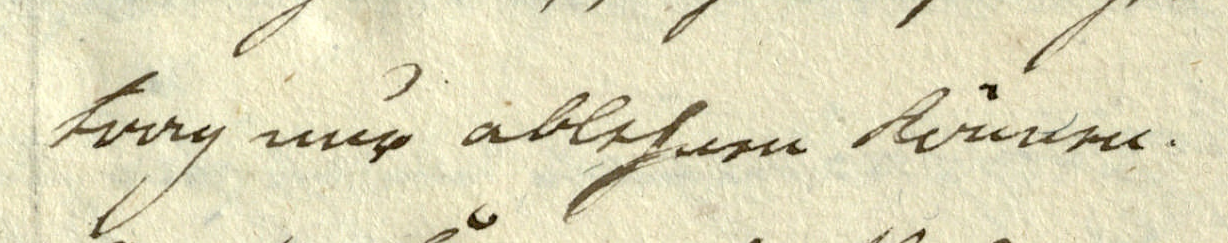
trag nur ablehnen können.
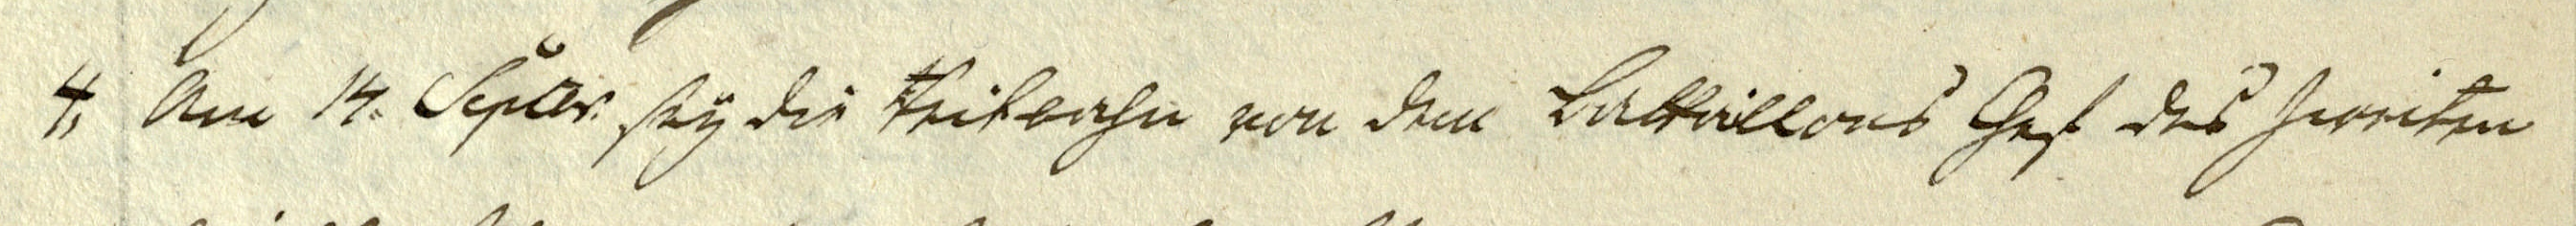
4. Am 14. Septbr. seÿ die Reitbahn von dem Battaillons Chef des zweiten
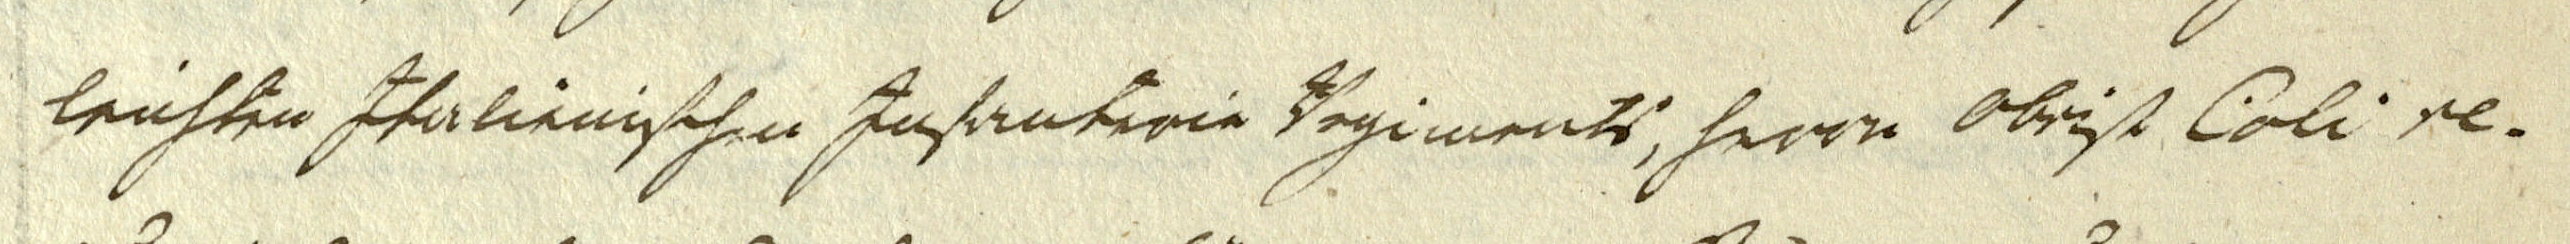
leichten Italienischen Infanterie Regiments, Herrn Obrist Coli re¬
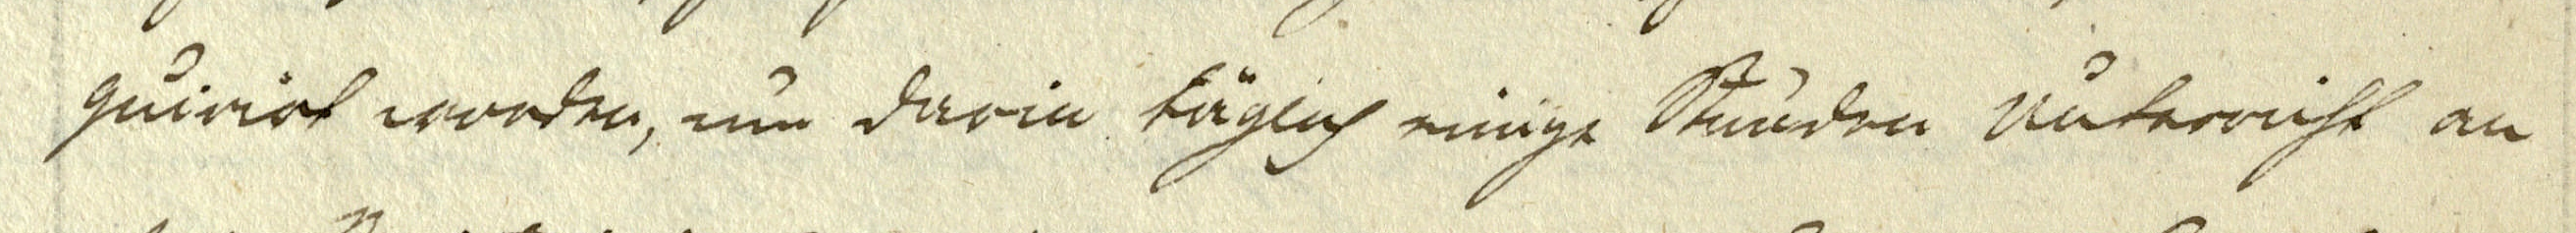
quirirt worden, um darin täglich einige Stunden Unterricht an
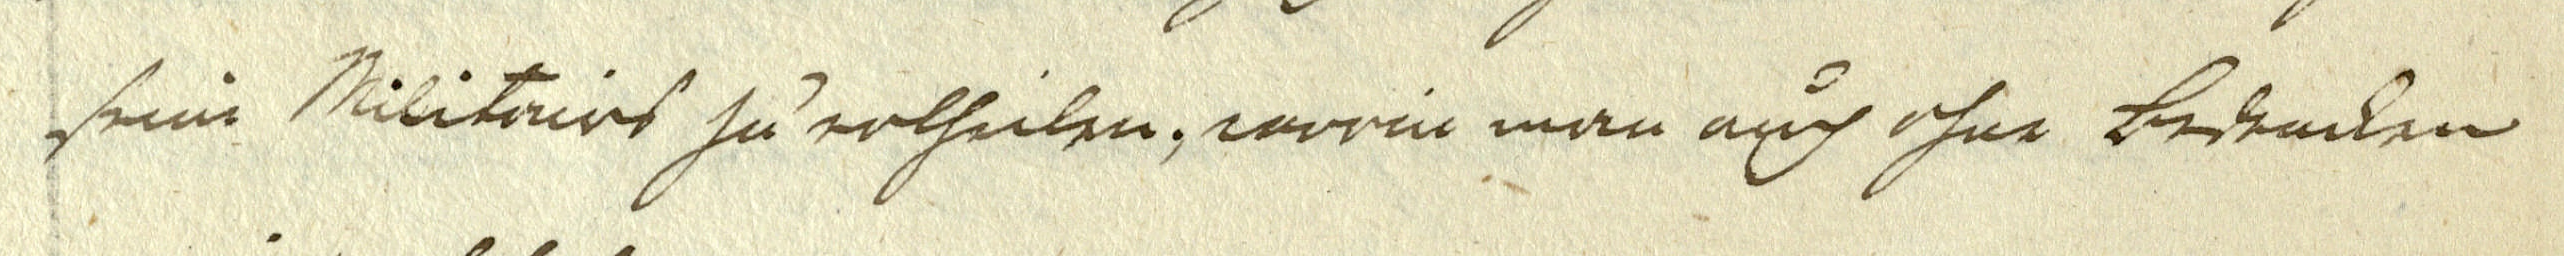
seine Militairs zu ertheilen, worin man auch ohne Bedencken
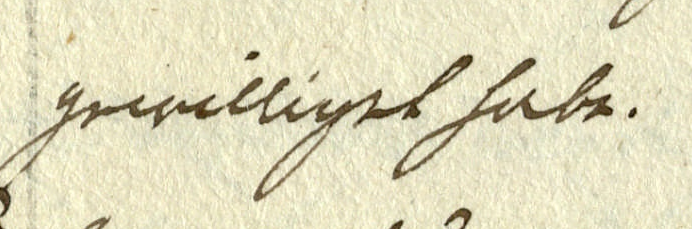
gewilliget habe.
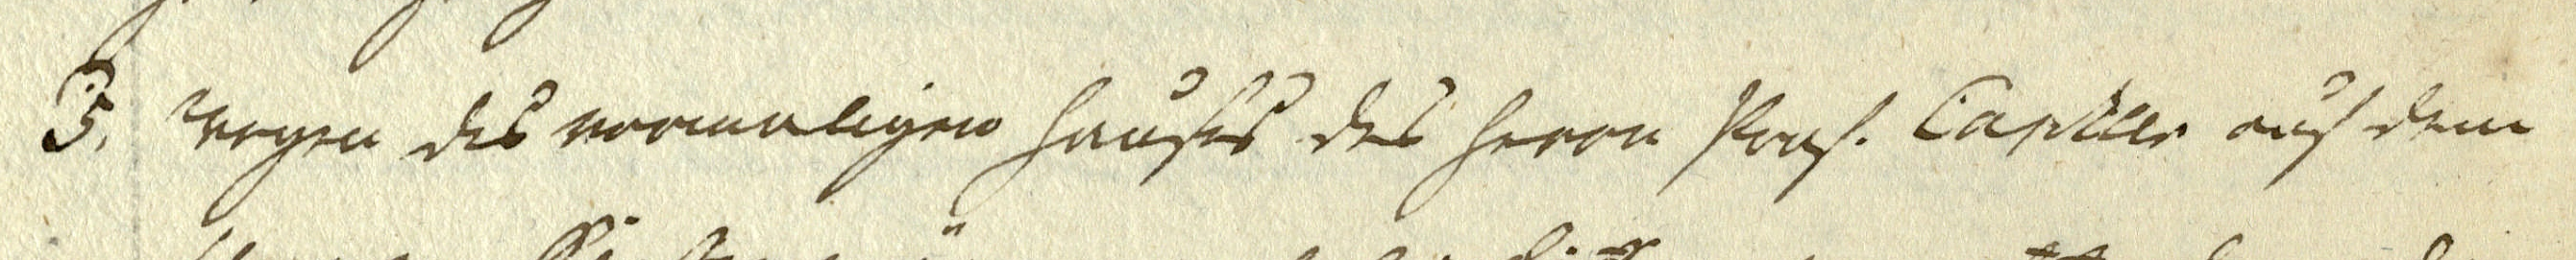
5. Wegen des vormaligen Hauses des Herrn Prof. Canzler auf dem
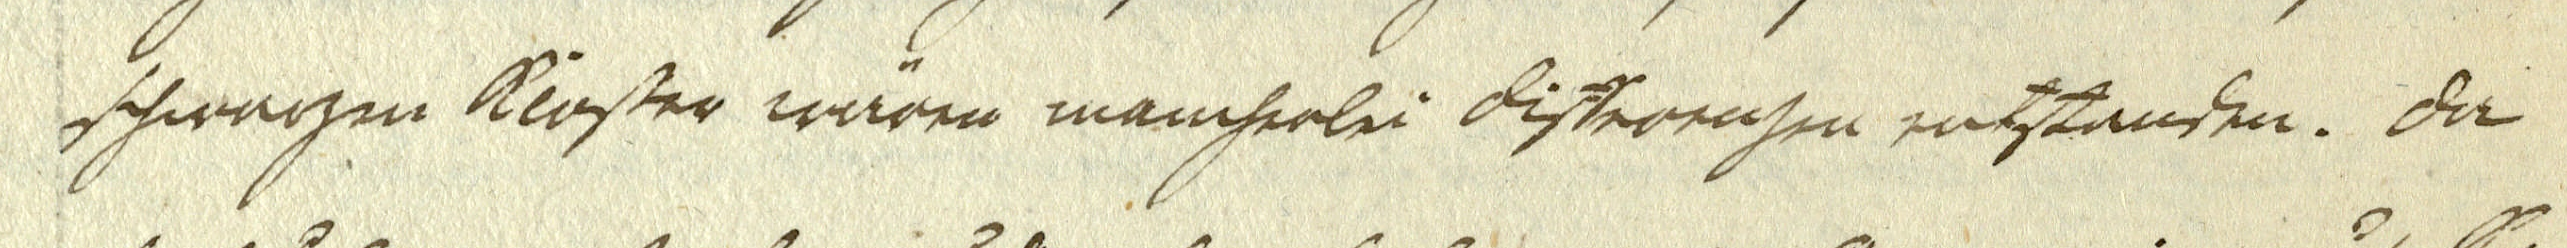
schwarzen Kloster wären mancherlei Differenzen entstanden. Da
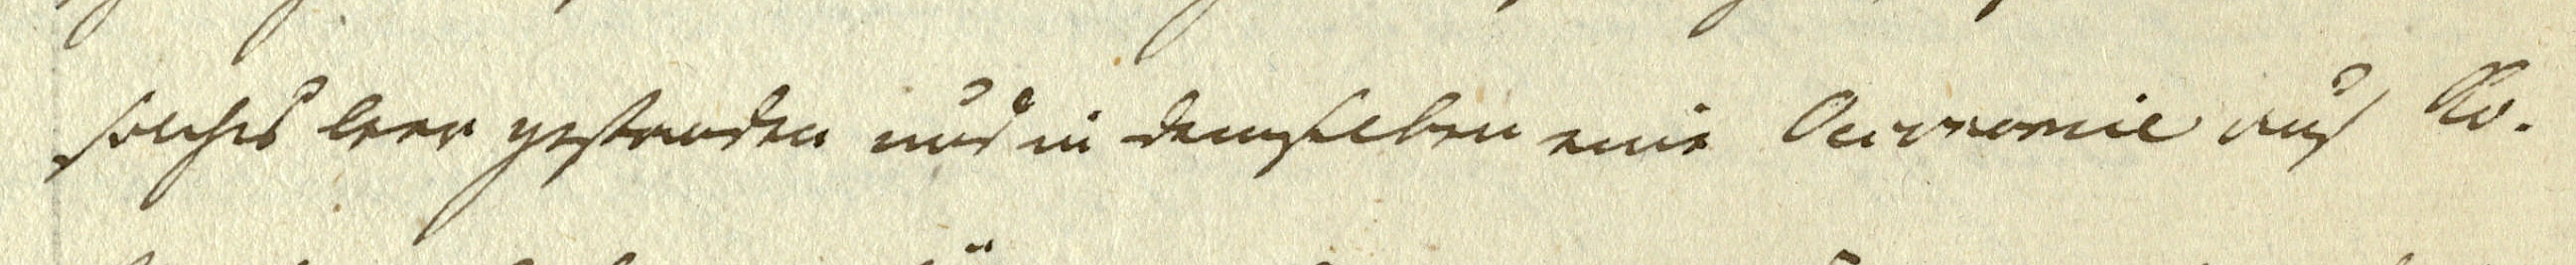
solches leer gestanden und in demselben eine Oeconomie auf Ko¬
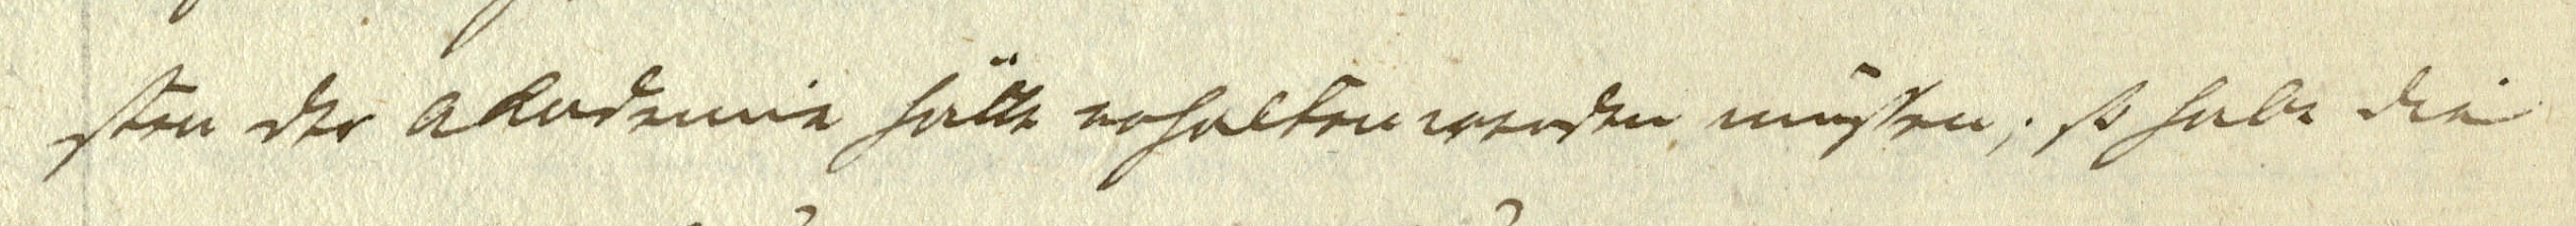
sten der Akademie hätte erhalten werden müssen, so habe die
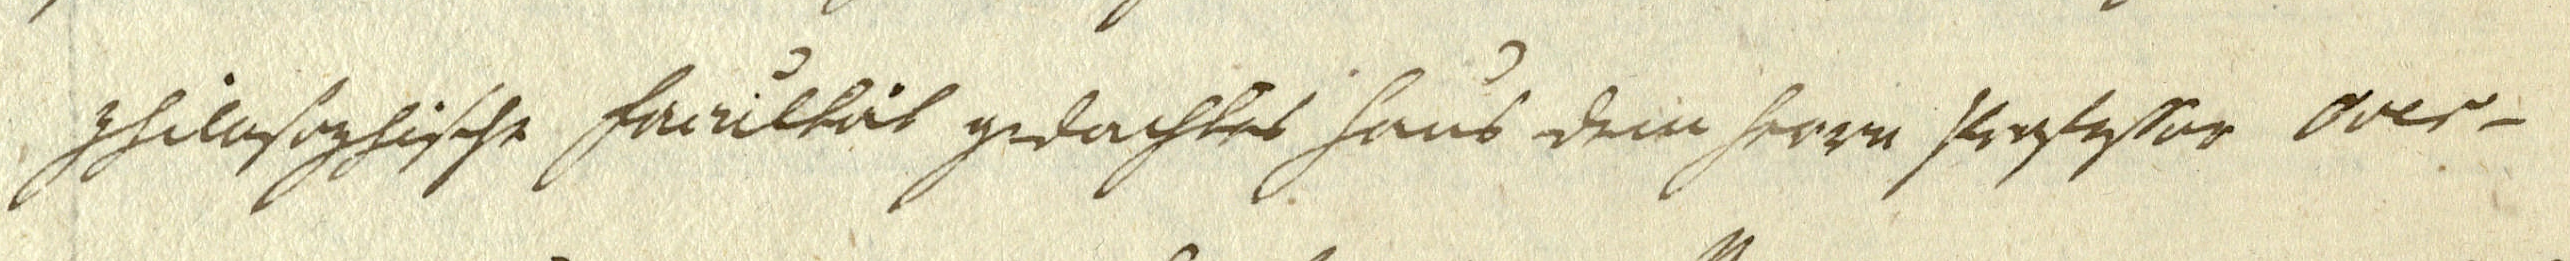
philosophische Facultät gedachtes Haus dem Herrn Professor Over¬
